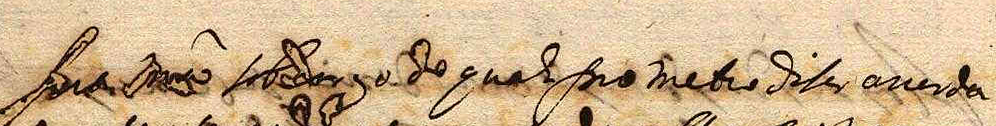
sua maõ sob cargo do qual prometeo diser a uerda
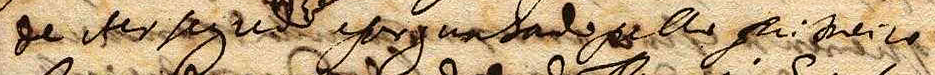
de e ter segredo e perguntado pello primeiro
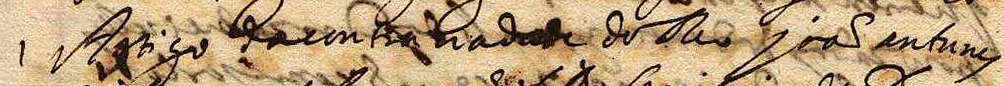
1 Artigo da contrariadade do Reo joaõ antunes
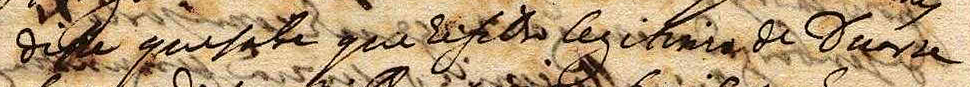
disse que sabe que he filho legitimo de Duarte
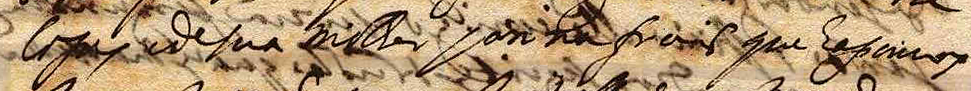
lopes e de sua molher joana froins que ha poucos
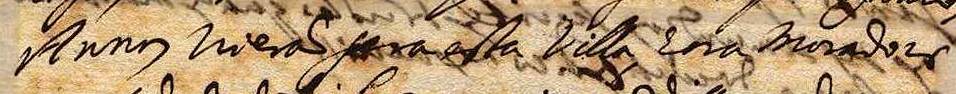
Annos uieraõ para esta Villa, E ora moradores
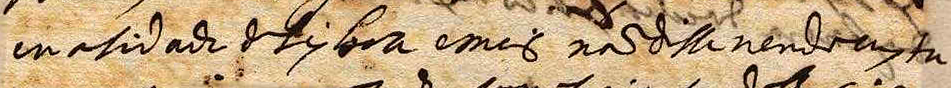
en a sidade de Lisboa e mais naõ disse nen do custu
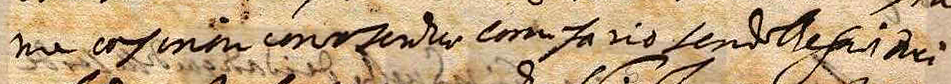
me e asinou con o senhor comisario sendolhe primei
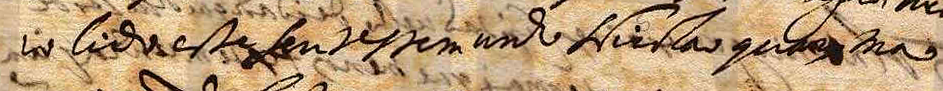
ro lido este seu testemunho Nicolao quaresma
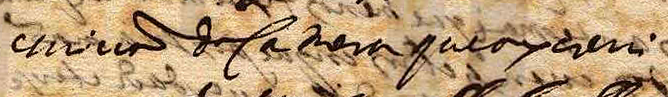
escriuaõ da Camera que o escreui
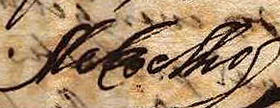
Mel Coelho
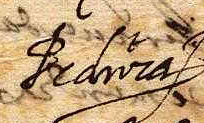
Pedroza
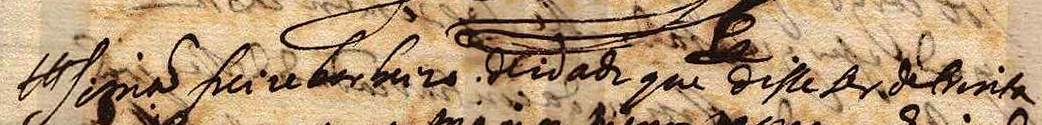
item Simaõ freire barbeiro de idade que disse ser de trinta
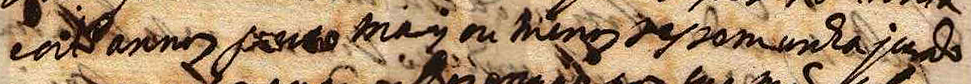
e oito annos pouco mais ou menos testemunha jurado
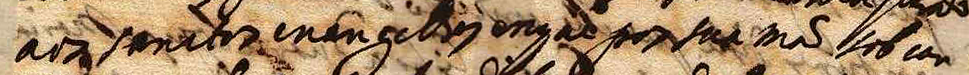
aos sanctos euangelhos en que pos sua maõ sob car
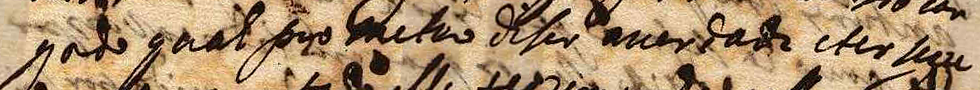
go do qual prometeo diser a uerdade e ter segre
